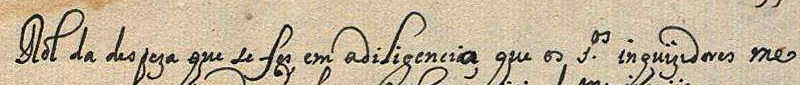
Rol da despeza que se fes em a diligencia que os s.res inquizidores me
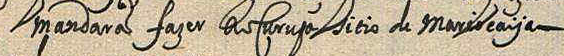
mandarā fazer ao Curupá sitio de mariocaija
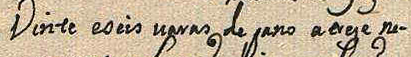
Vinte e seis uaras de pano a treze ne
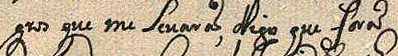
gros que me Leuaraõ, digo que forā
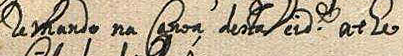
Remando na Canoa, desta cid.e athe
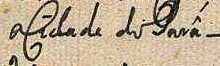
a Cidade do Parâ
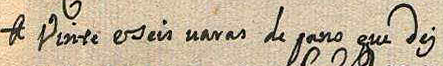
item Vinte e seis uaras de pano que dej
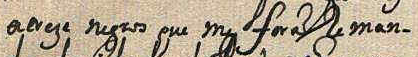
a treze negros que me foraõ Reman
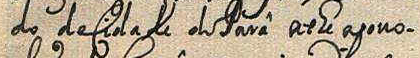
do da Cidade do Parâ athe a pouo
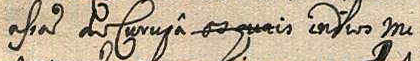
assaõ do Curupâ os quais indios me
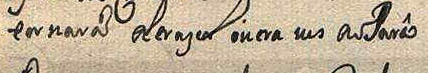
tornarā a trazer outra ues ao Parâ
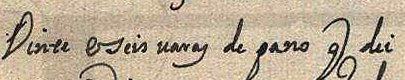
Vinte e seis uaras de pano q̄ dei
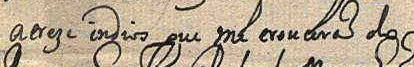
a treze indios que me troucerā do
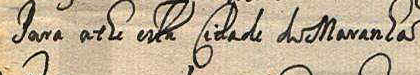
Para athe esta Cidade do Maranhā
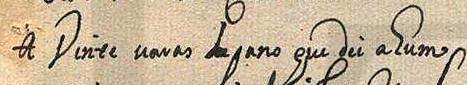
item Vinte uaras de pano que dei a hum
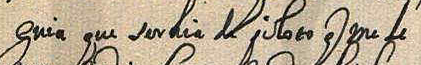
Guia que seruia de piloto q̄ me le
